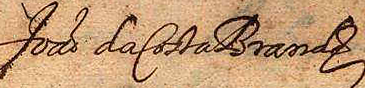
João da Costa Brandaõ
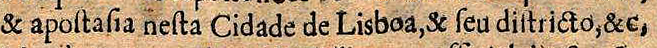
& apostasia nesta Cidade de Lisboa, & seu districto, &c,
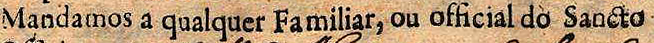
Mandamos a qualquer Familiar, ou official do Sancto
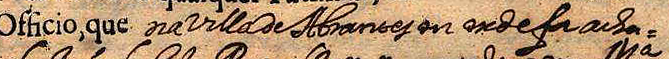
Officio, que na Villa de Abrantes ou onde for acha
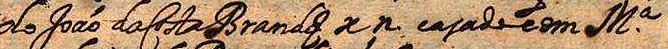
do Joaõ da Costa Brandaõ x n. casado com M.a
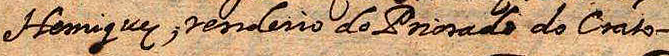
Henriques, rendeiro do Priorado do Crato
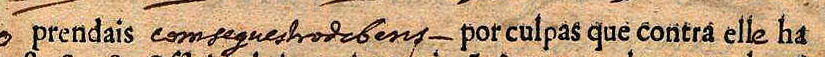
o prendais com sequestro de bens por culpas que contra elle ha
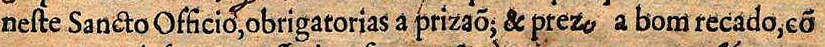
neste Sancto Officio, obrigatorias a prizaõ; & prezo a bom recado, cō
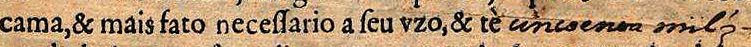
cama, & mais fato necessario a seu vzo, & tè cincoenta mil
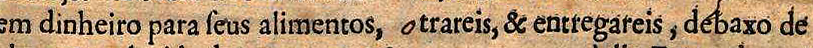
em dinheiro para seus alimentos, o trareis, & entregareis, debaxo de
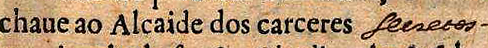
chaue ao Alcaide dos carceres secretos
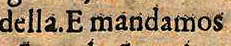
della. E mandamos
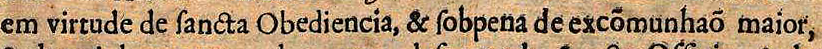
em virtude de sancta Obediencia, & sob pena de excōmunhaõ maior,
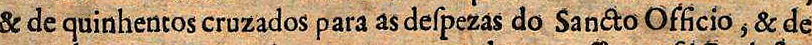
& de quinhentos cruzados para as despezas do Sancto Officio, & de
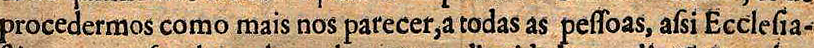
procedermos como mais nos parecer, a todas as pessoas, assi Ecclesia
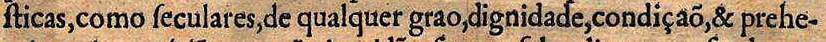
sticas, como seculares, de qualquer grao, dignidade, condiçaõ, & prehe
